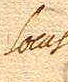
Locus
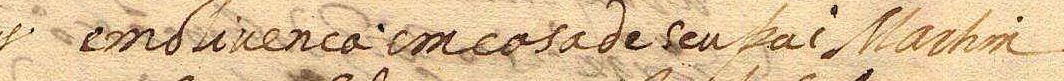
em oliuença em casa de seu pai Martim
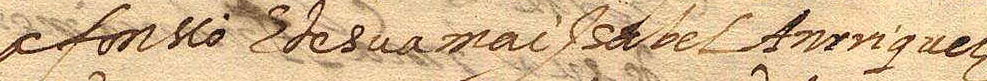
afonsco E de sua mai Jsabel Anrriquez
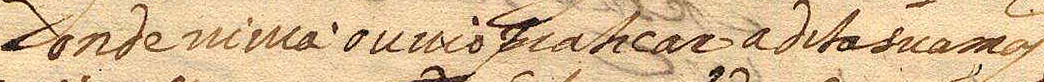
onde uiuia ouuio praticar a dita sua maj
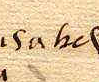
isabel
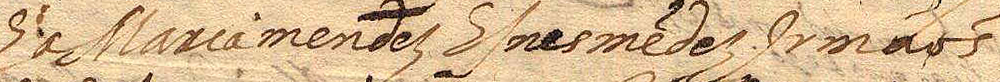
E a Maria mendez E Jnes mēdez Jrmãos
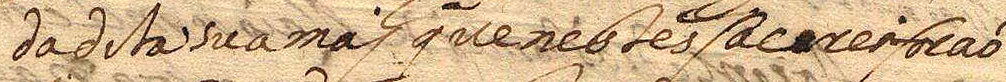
da dita sua maj que nestes Caceres foraõ
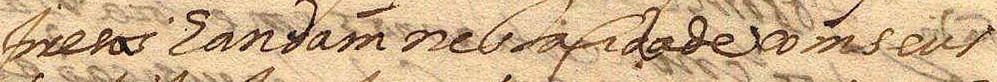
presos E andam nesta Cidade com seus
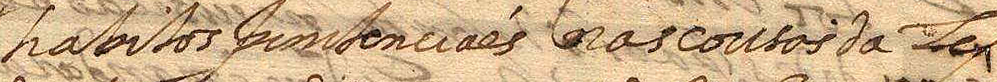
habitos penitenciaes nas cousas da Lej
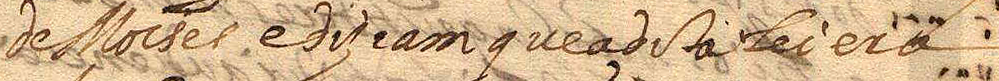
de Moises e diziam que a dita Lei era
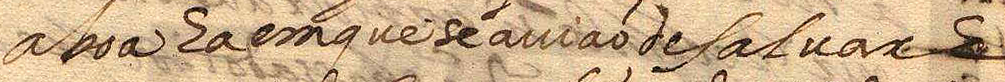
a boa E a em que se auiaõ de Saluar E
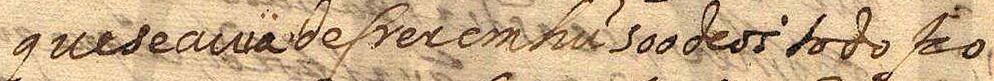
que se auia de Crer em hū soo deos todo po
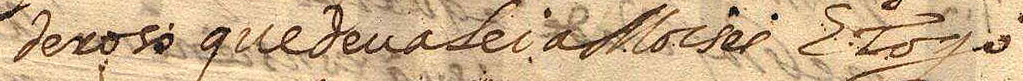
deroso que deu a Lei a Moises E logo
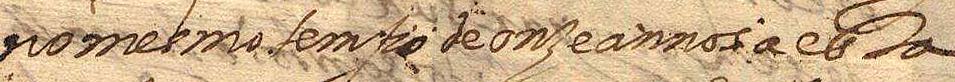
no mesmo tempo de onze annos a esta
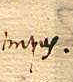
tmpus.
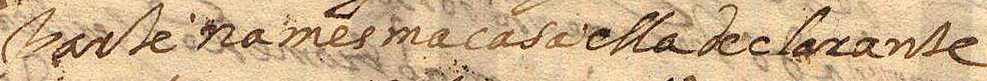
parte na mesma casa ella declarante
